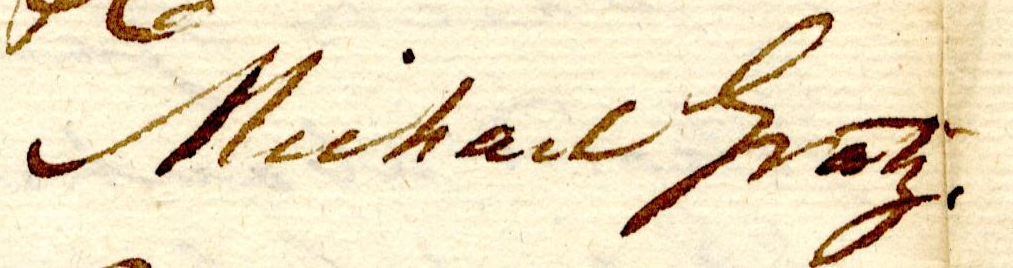Michael Gratz
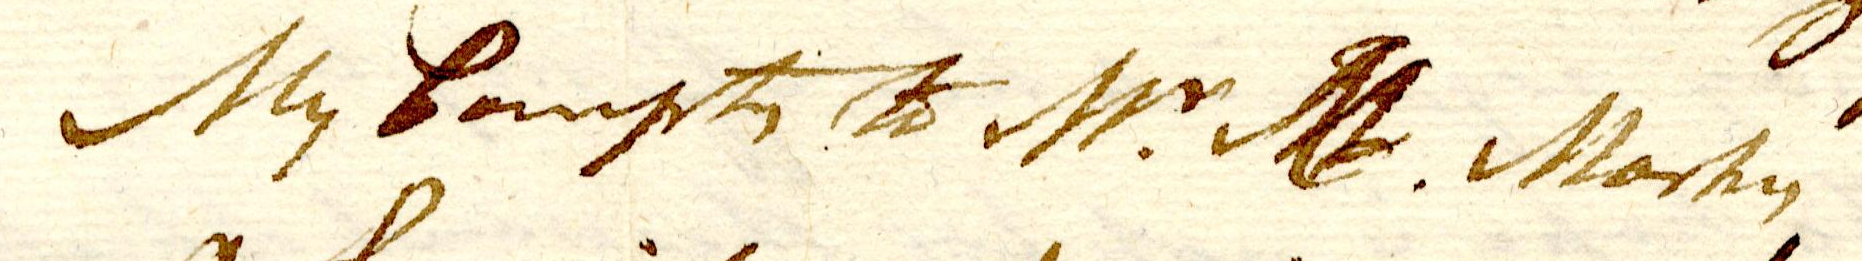My Compts to M^r M Marks
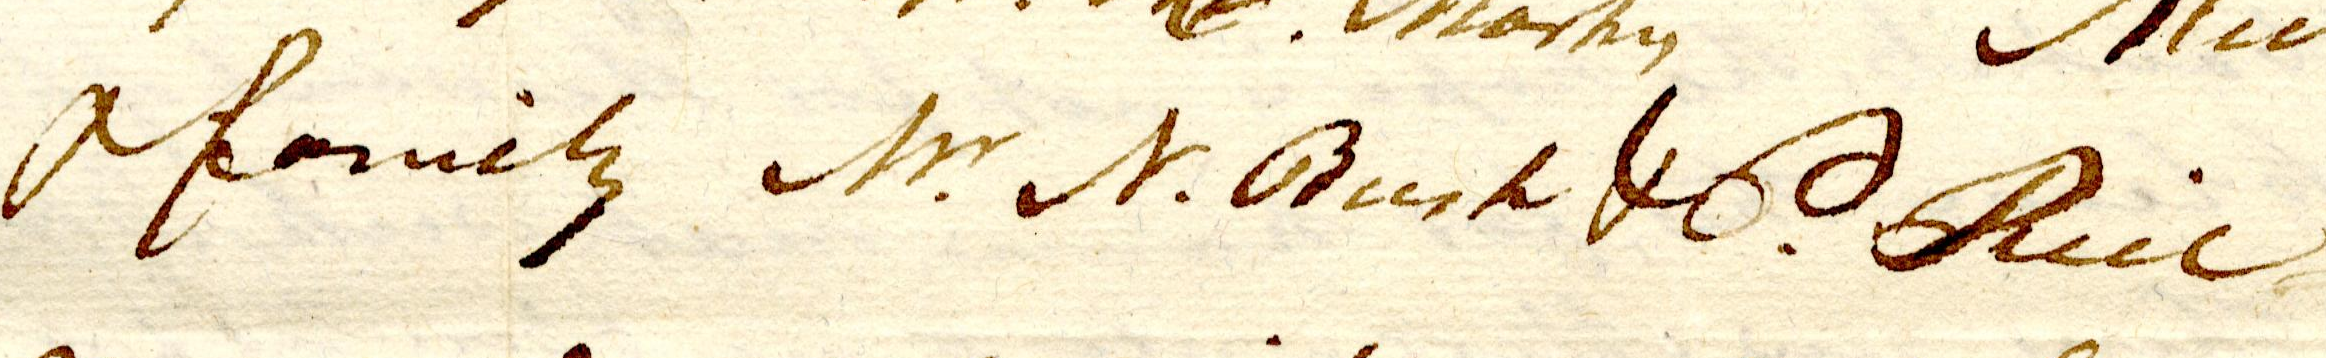& family M^r N. Bush & C. Rice
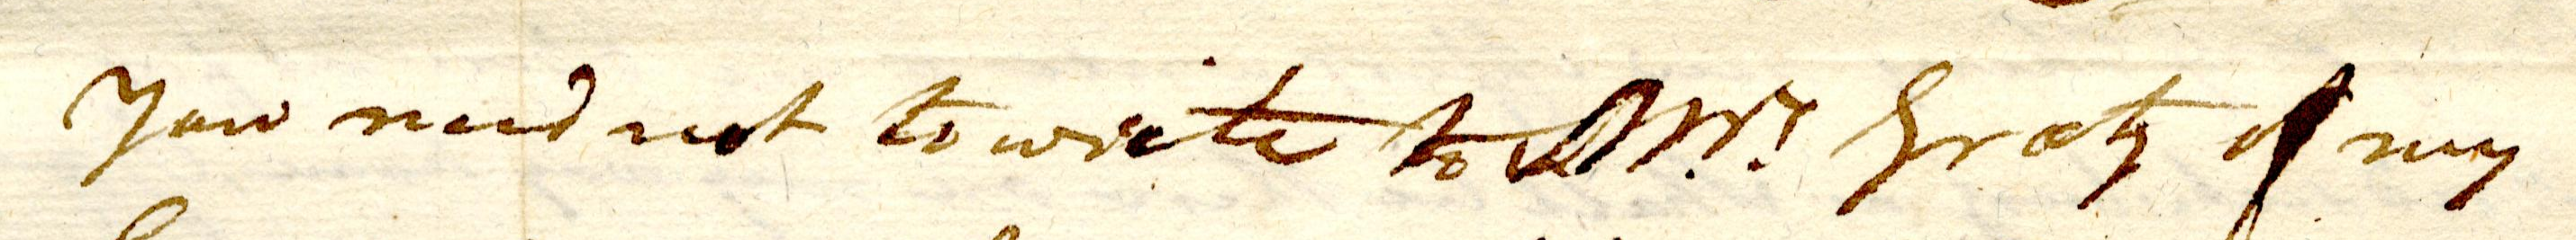you need not to write to M^rs. Gratz of my
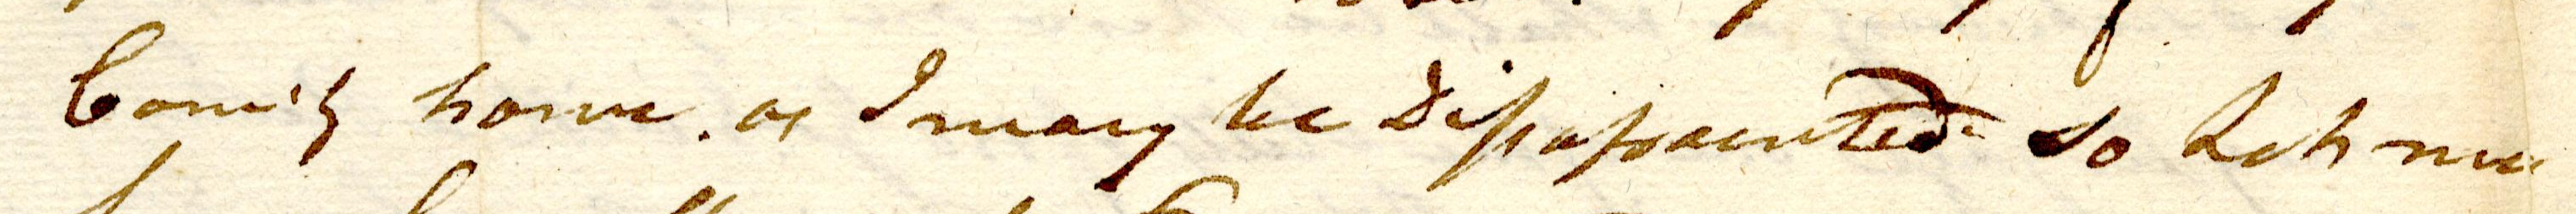Come'g home as I may be Dissapointed so Let me
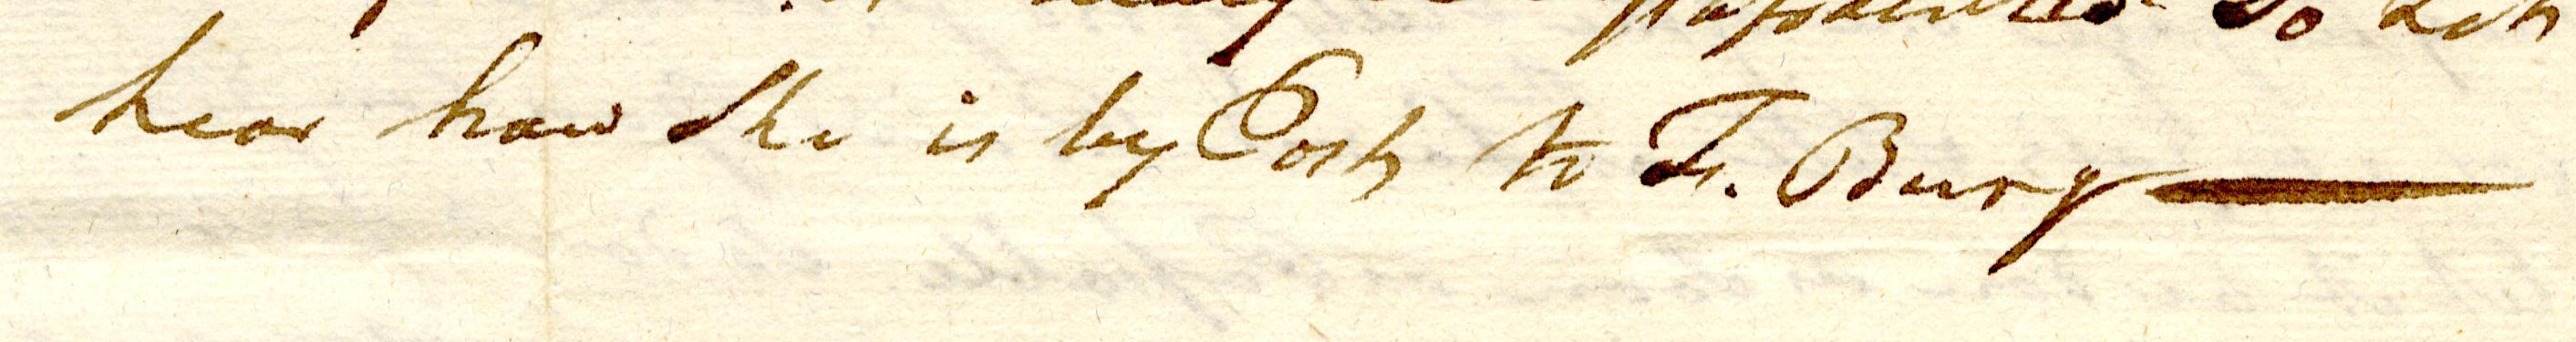hear how she is by Cash to FrBurg.-
